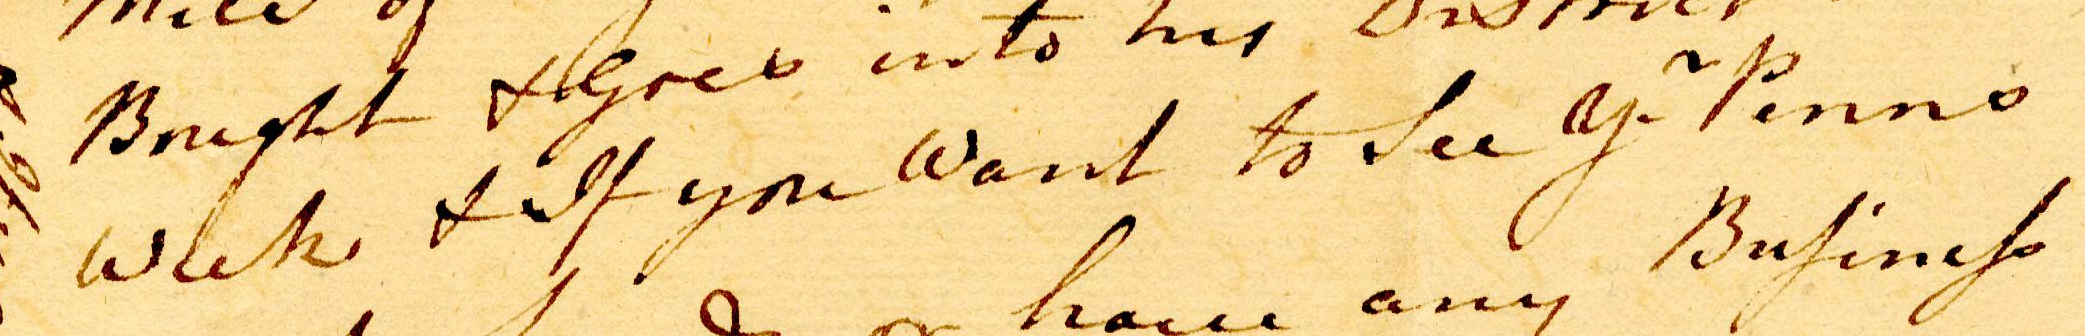week & If you want to see y^r Penns
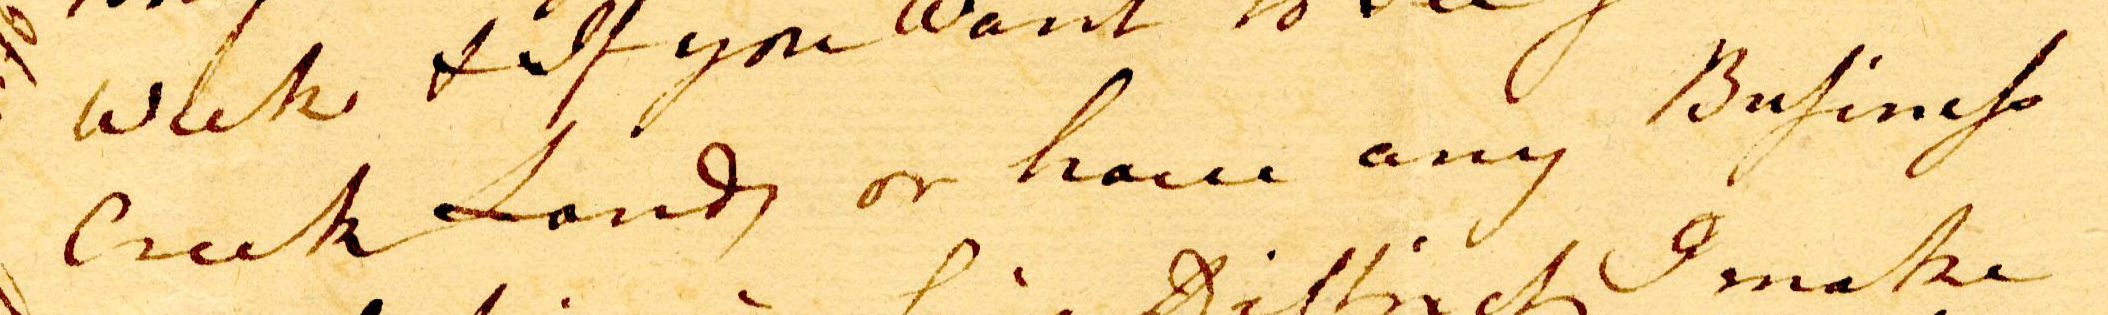Creek Lands or have any Business
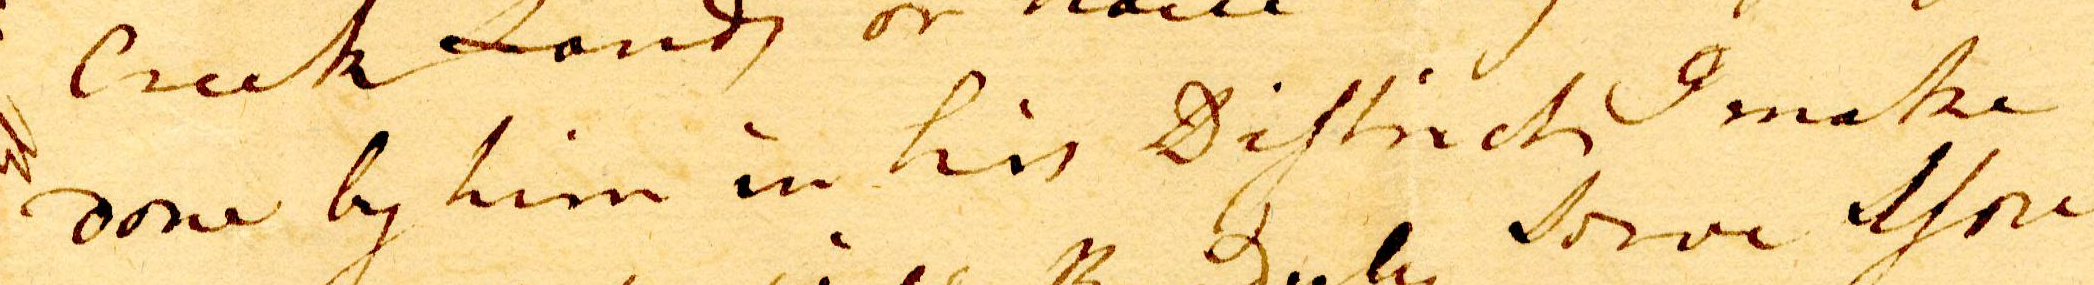done by him in his District I make
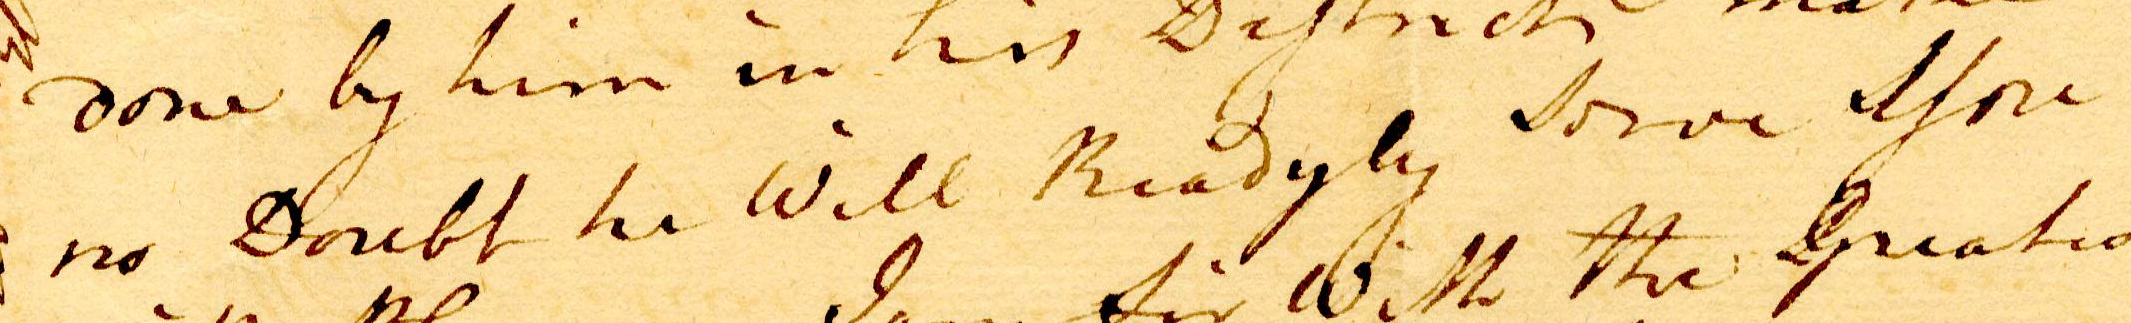no Doubt he will Readly serve You
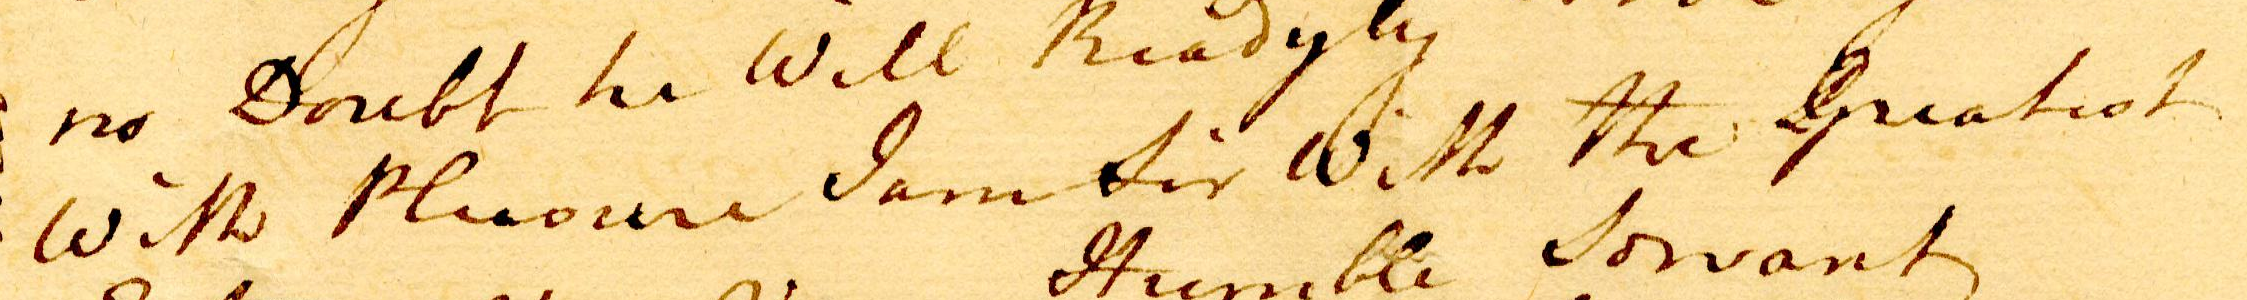with Pleasure I am Sir with the Greatest
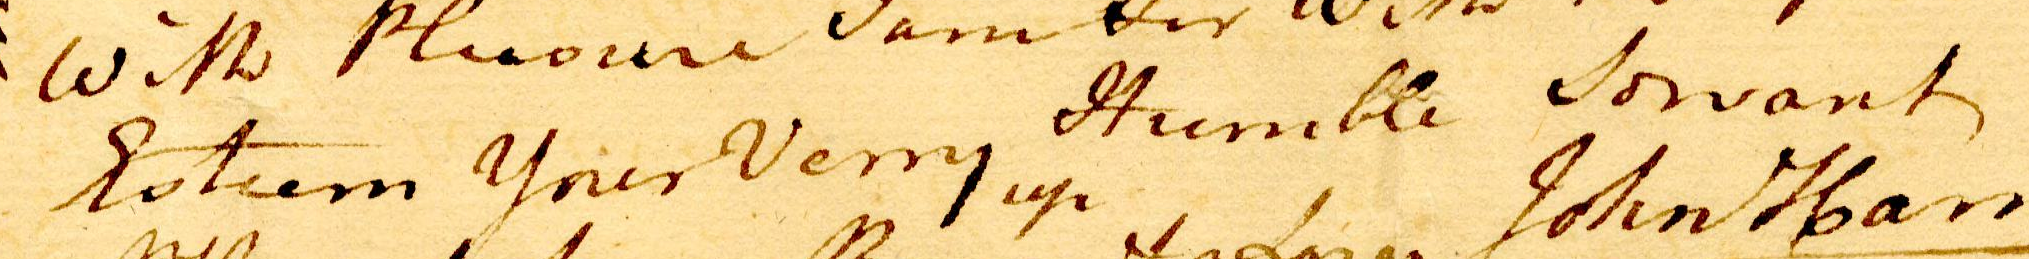Esteem your Verry Humble Servant
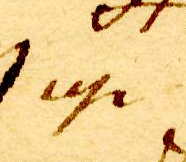up
